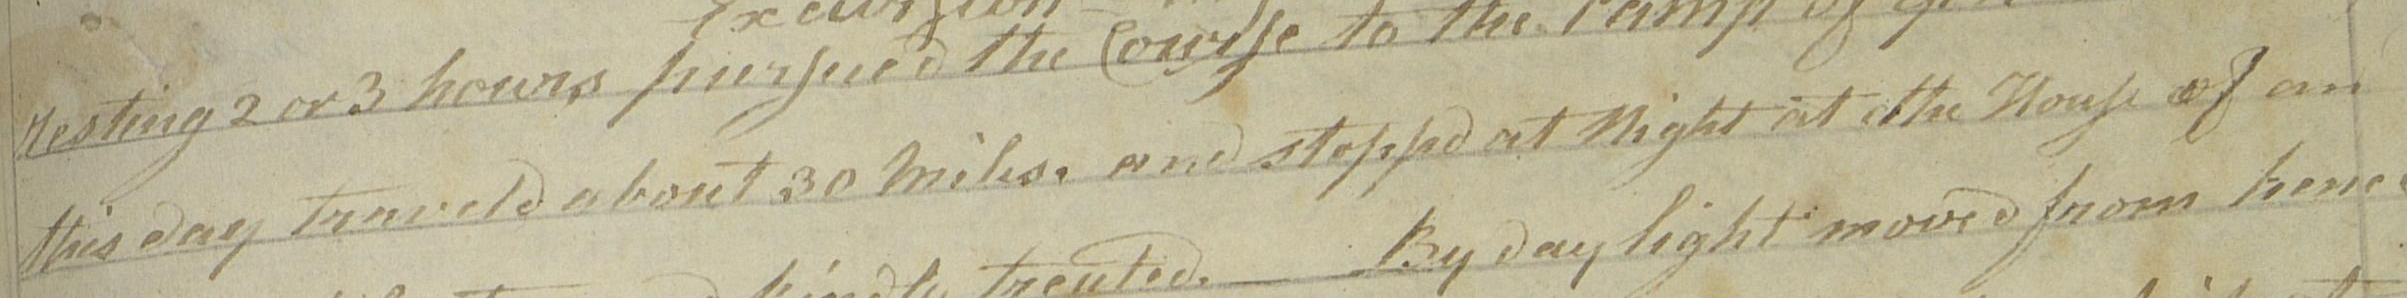this day travel'd about 30 miles and stoppd at night at the House of an
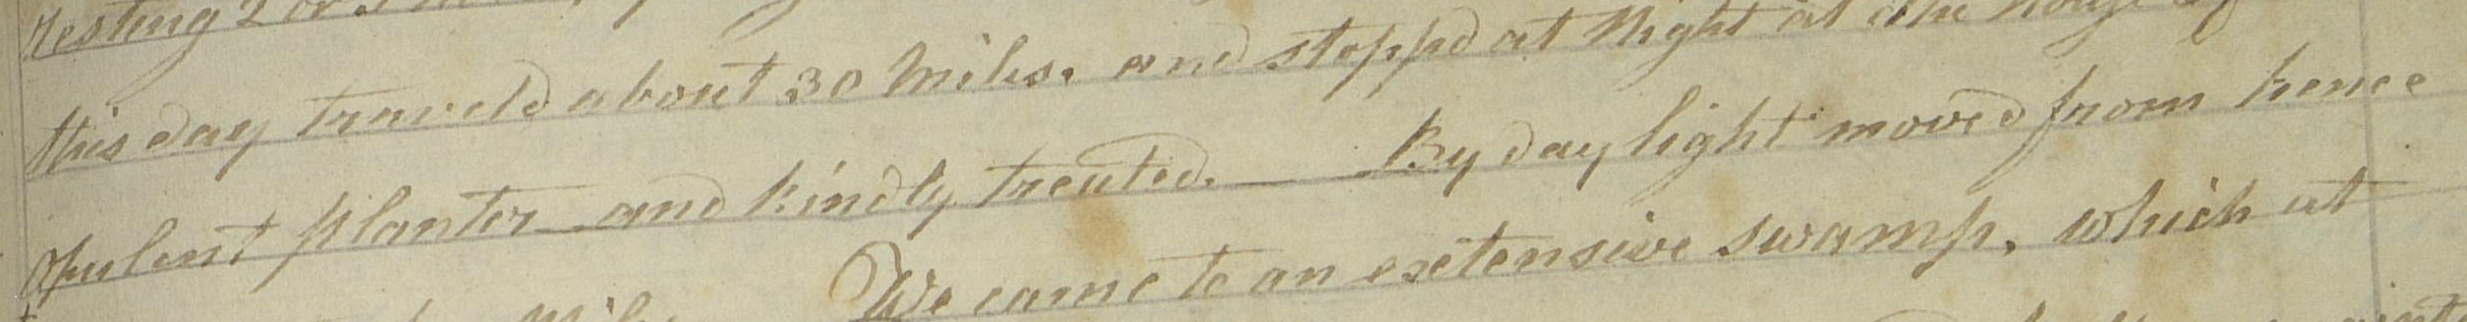Opulent planter and kindly treated. By day light moved from hence
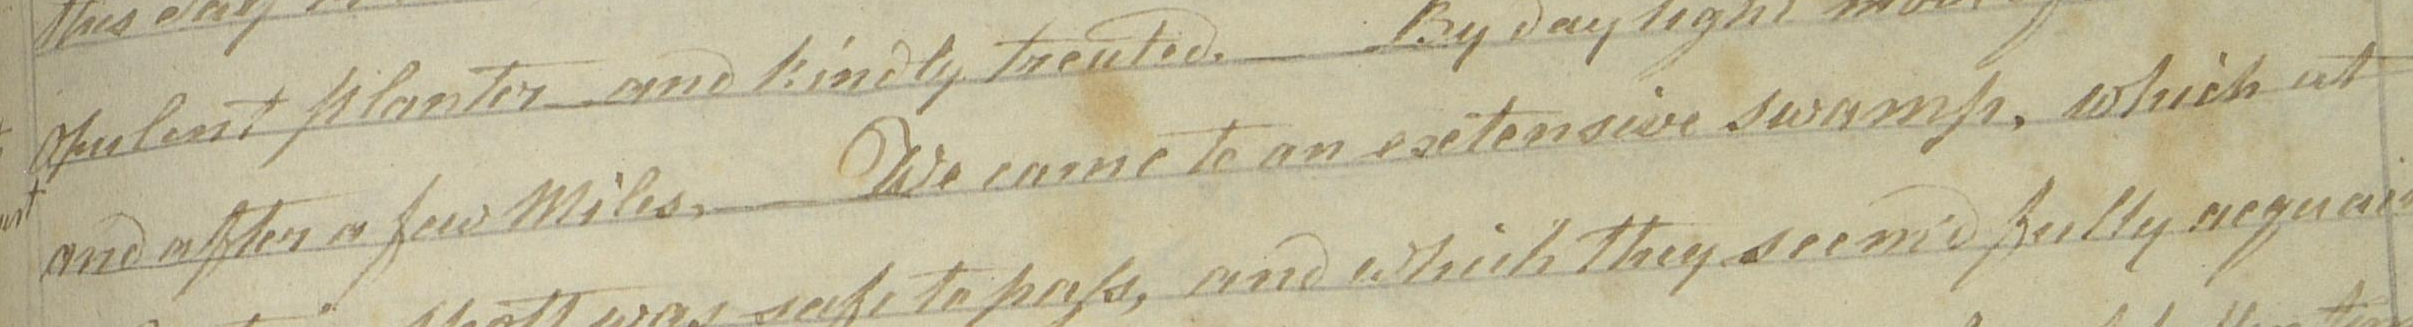and after a few Miles. We came to an extensive swamp, which at
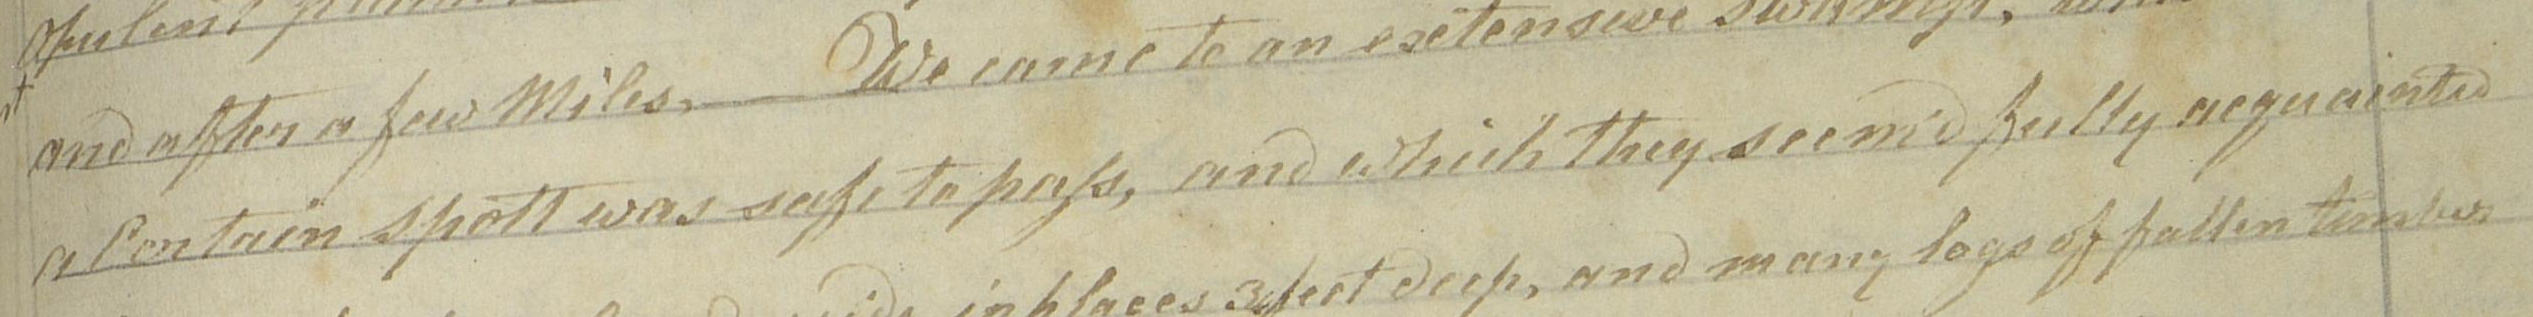a Certain spott was safe to pass, and which they seem'd fully acquainted
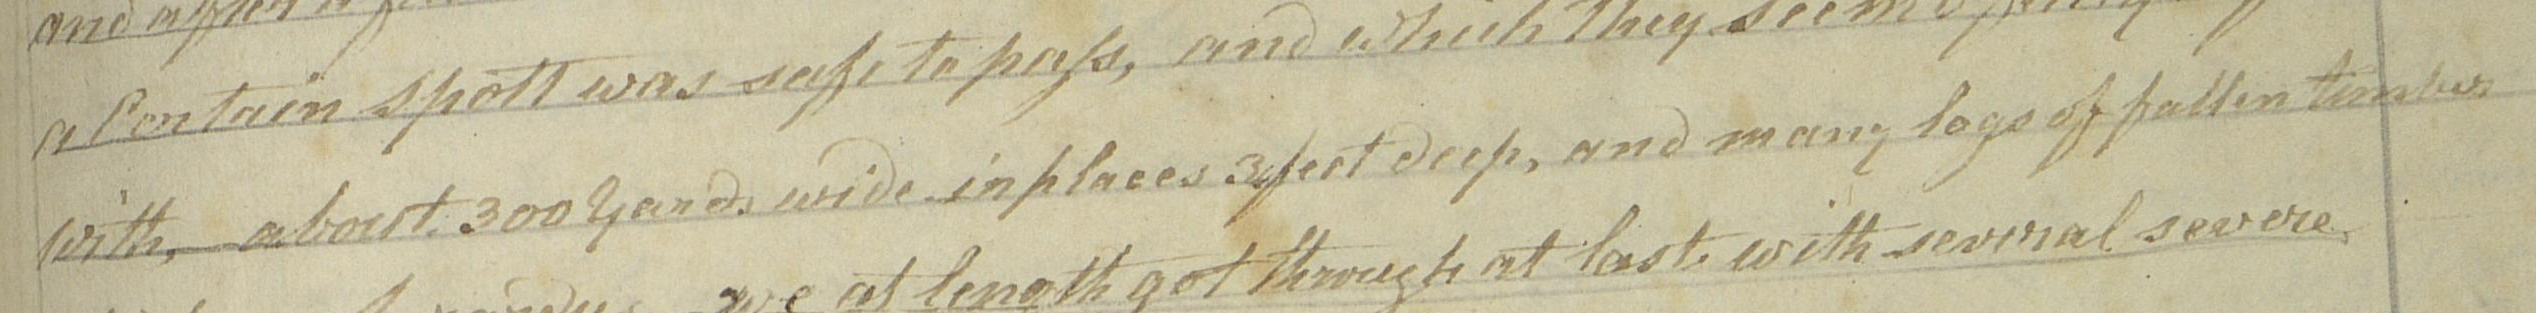with, about 300 yards wide in places a feet deep, and many logs of fallen timber
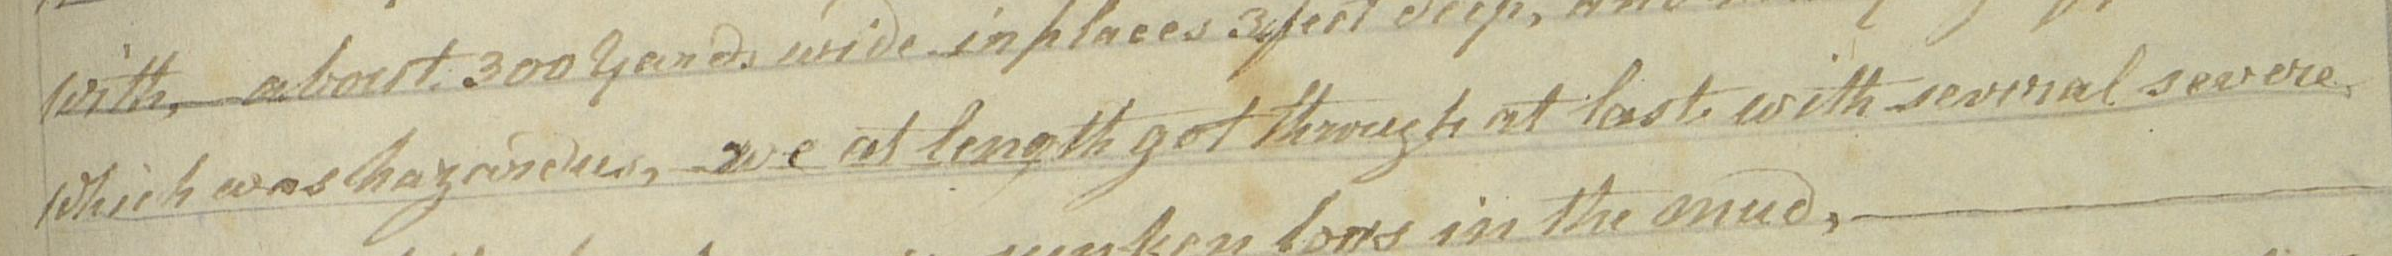Which was hazardous, we at length got through at last with several severe
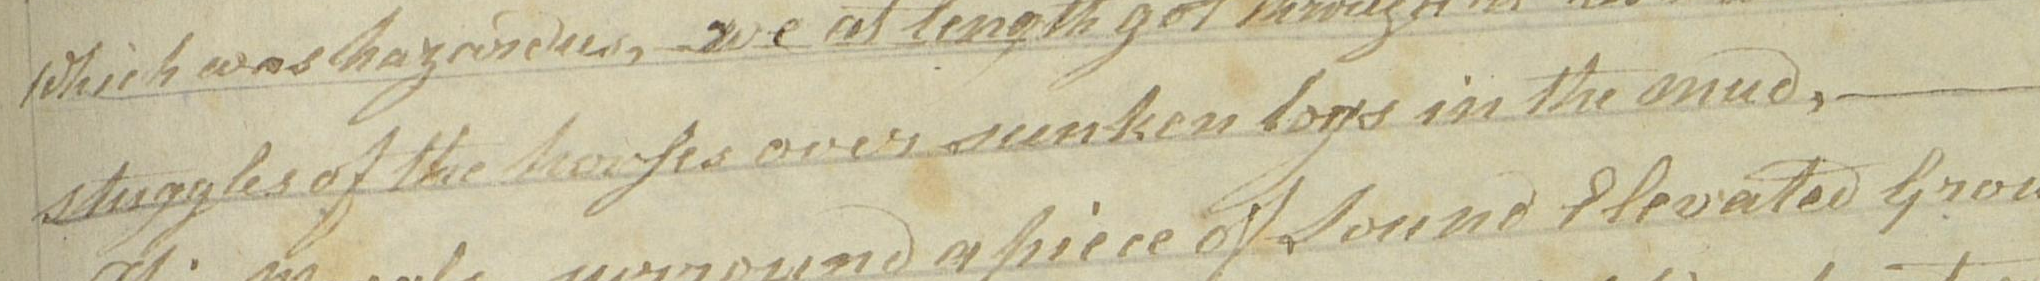struggles of the horses over sunken logs in the mud.
